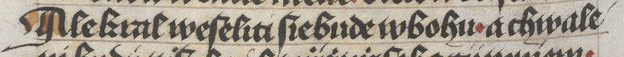Ale kral weſeliti ſie bude wbohu.a chwale¬
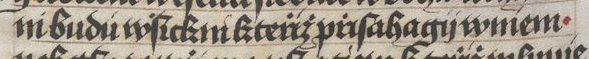ni budú wẛickni kteṙíż pṙiſahagij wníem.
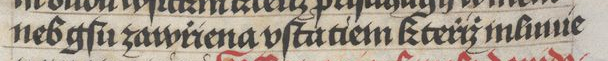neb gſu zawṙíena vſta tiem kteṙíż mluuíe
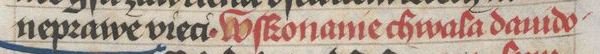neprawe vieci.Wſkonaníe chwala dauido¬
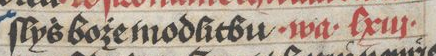ſlyṡ boże modlitbu .wa.lxiij.
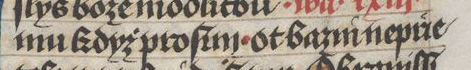mu kdyż proſim.ot bazni nepṙie¬
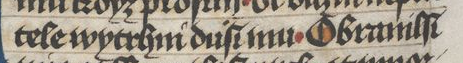tele wytrhni duẛi mu.Obranilſi
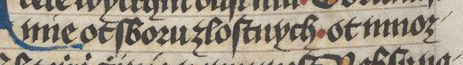mie ot ſboru zloſtnych.ot mnoz¬
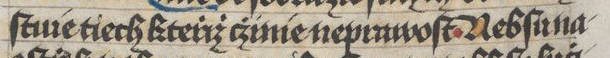ſtuíe tiech kteṙiż cżiníe neprawoſt.Neb ſu na¬
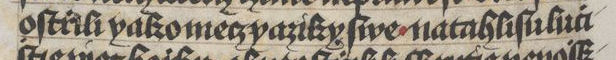oſtṙili yako mecz yaziky ſwe.natahliſu luċi¬
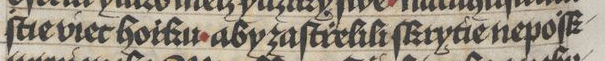ẛtie viec hoṙku.aby zaſtṙelili ſkrytie nepoẛk¬
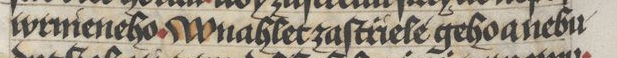wrnieneho.Wnahlet zaſtṙielé geho a nebu¬
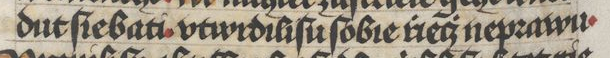dut ſie bati.vtwrdiliſu ſobie ṙiecż neprawu.
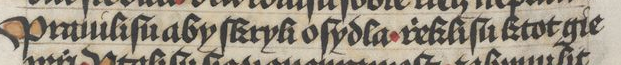Prauiliſu aby ſkryli oſydla.ṙekli ſu ktot gie
